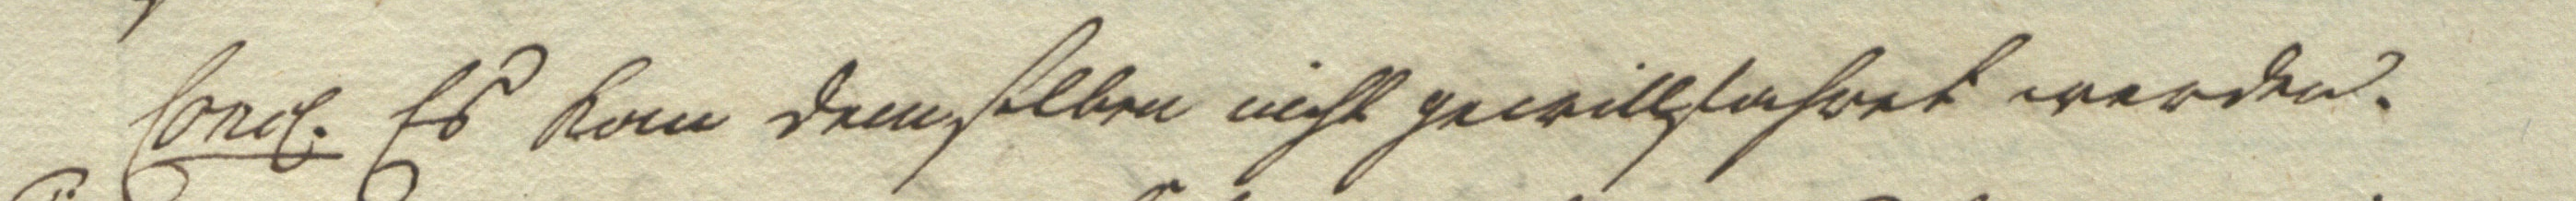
Concl. Es kan demselben nicht gewillfahret werden
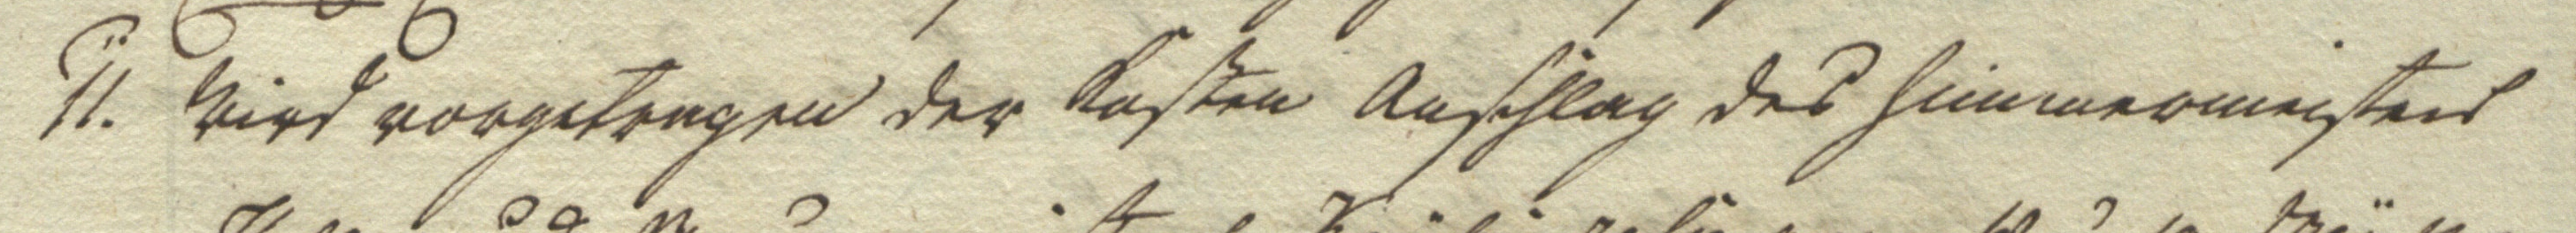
11. Wird vorgetragen der Kosten Anschlag des Zimmermeisters
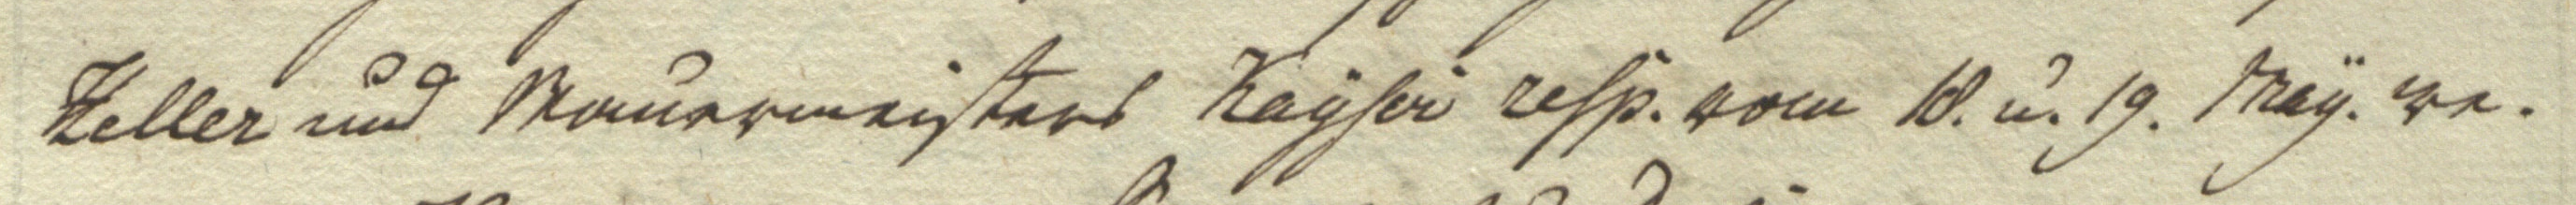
Heller und Mauermeisters Kayser resp. vom 18. u. 19. May. we¬
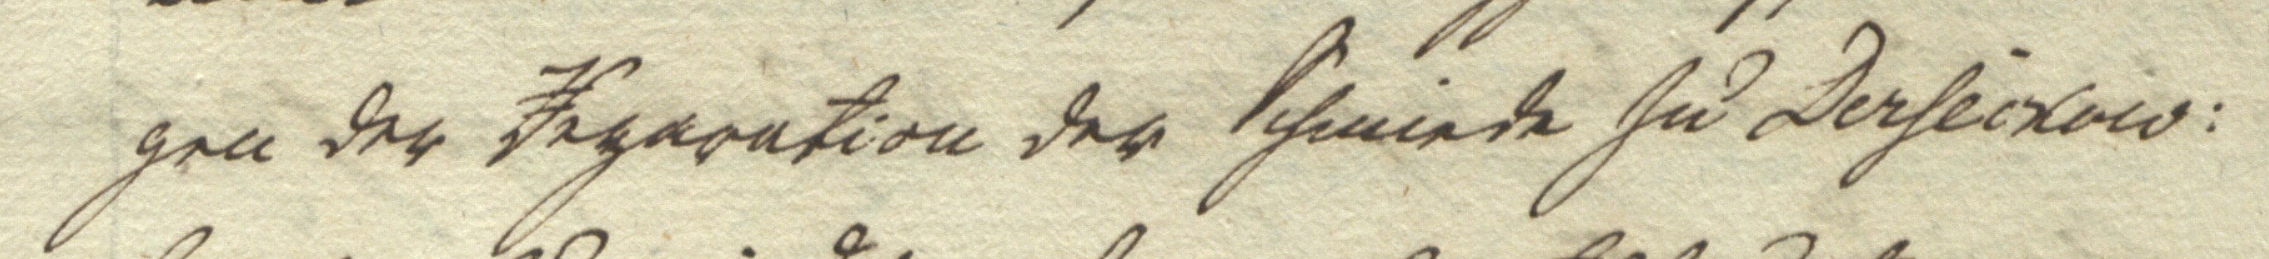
gen der Reparation der Schmiede zu Derseckow:
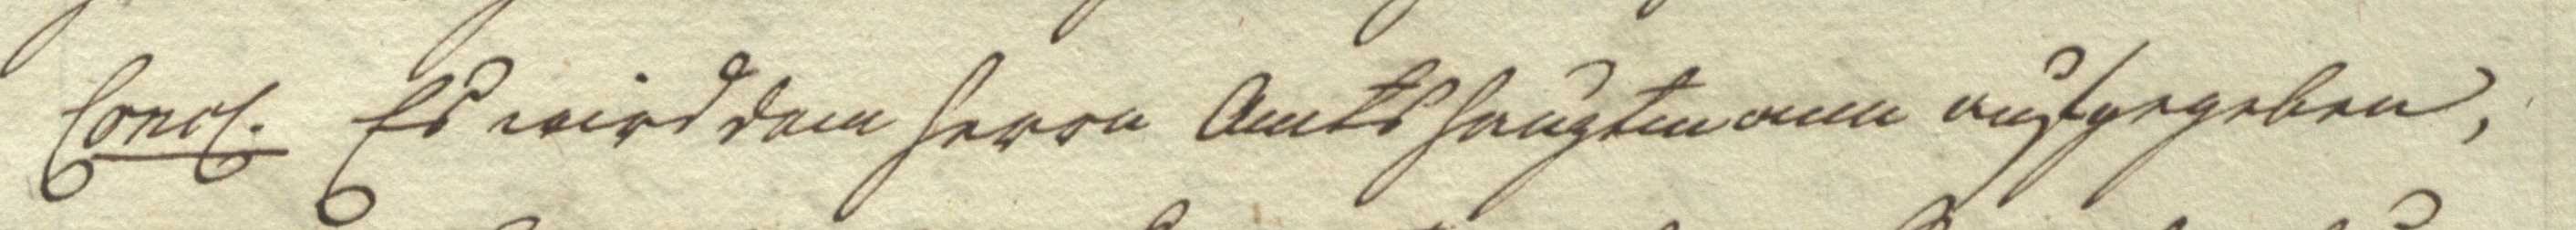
Concl. Es wird dem Herrn Amtshauptmann aufgegeben,
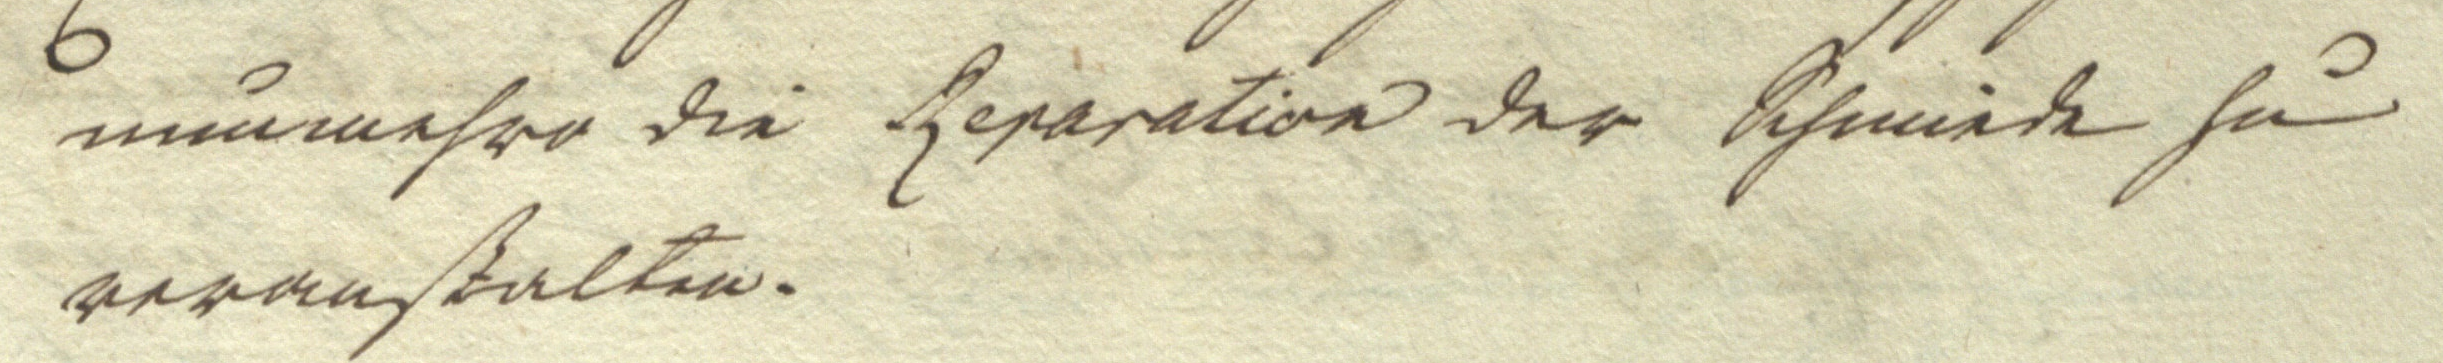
nunmehro die Reparation der Schmiede zu
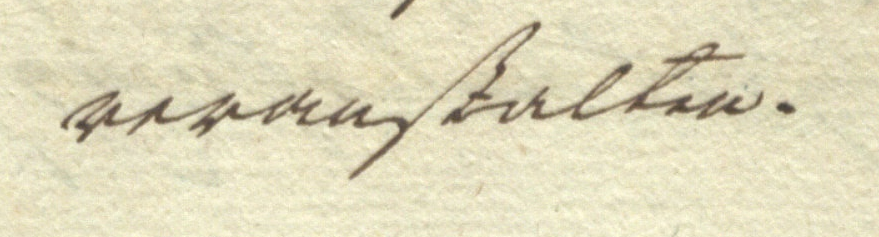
veranstalten.
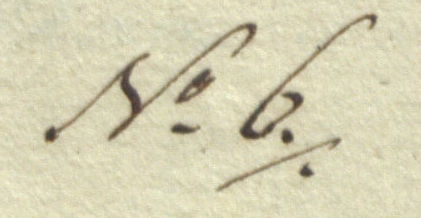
No. 6./.
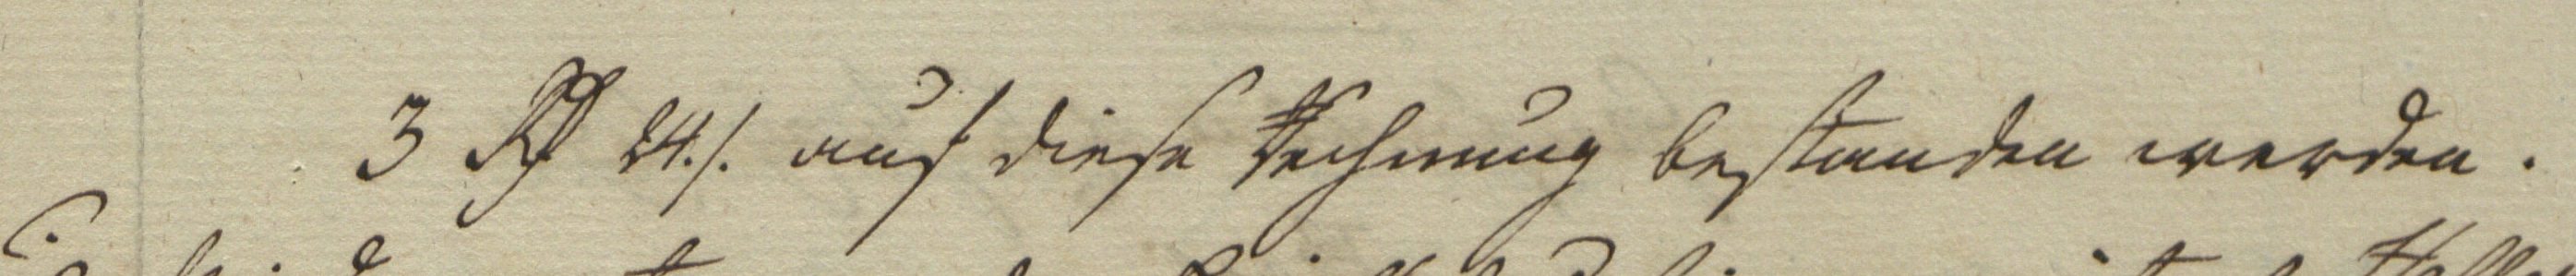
3 Rthl. 24 s. auf diese Rechnung bestanden werden.
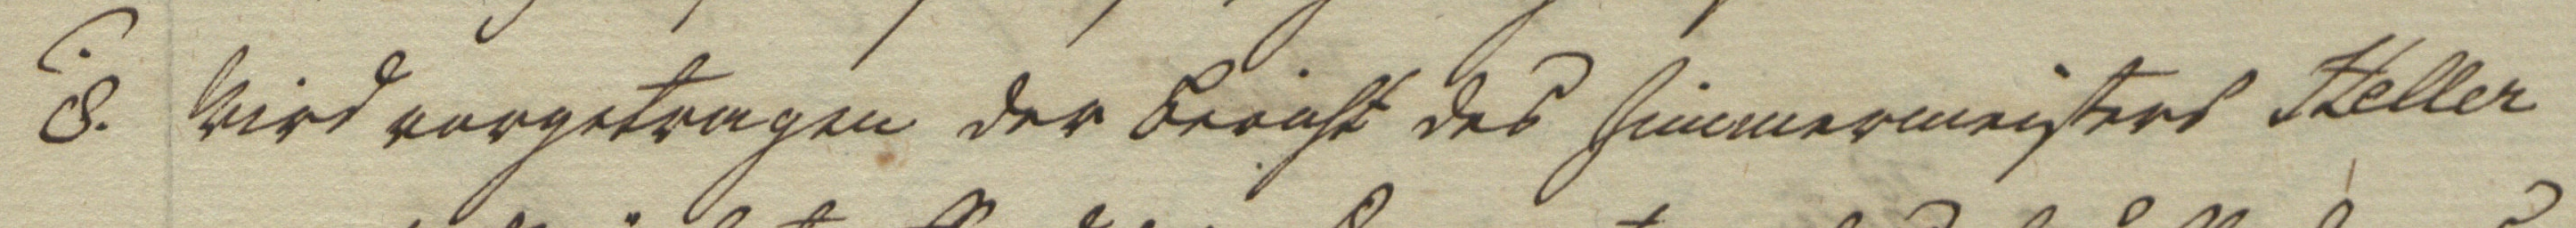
8. Wird vorgetragen der Bericht des Zimmermeisters Heller
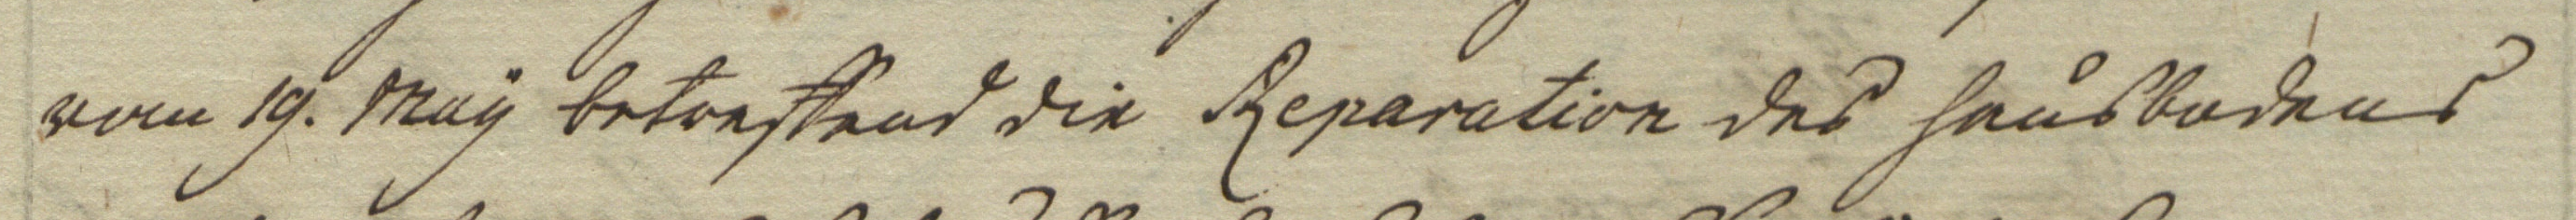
vom 19. May betreffend die Reparation des Hausbodens
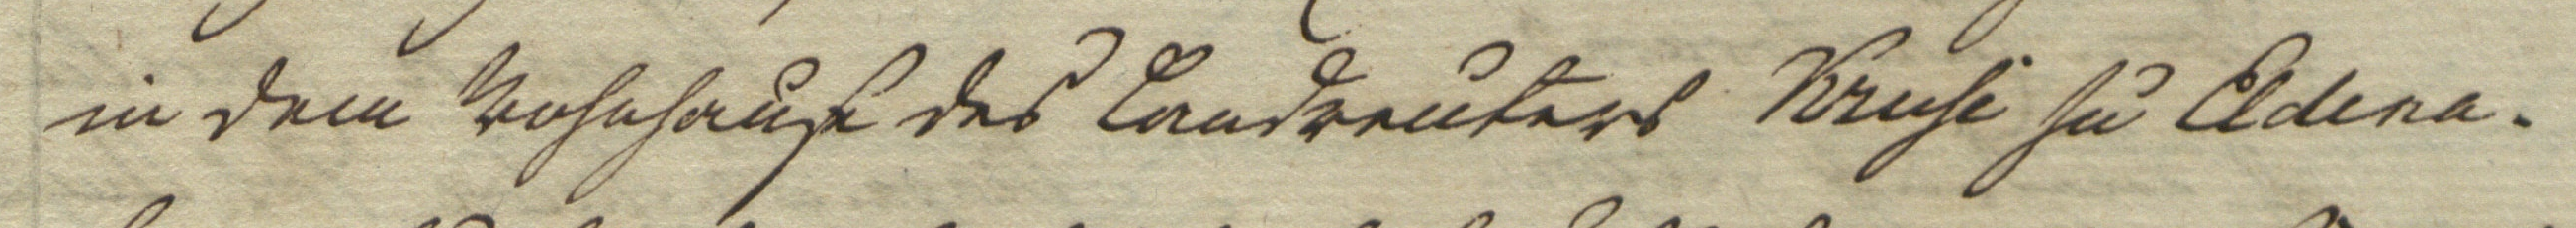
in dem Wohnhause des Landreuters Kruse zu Eldena.
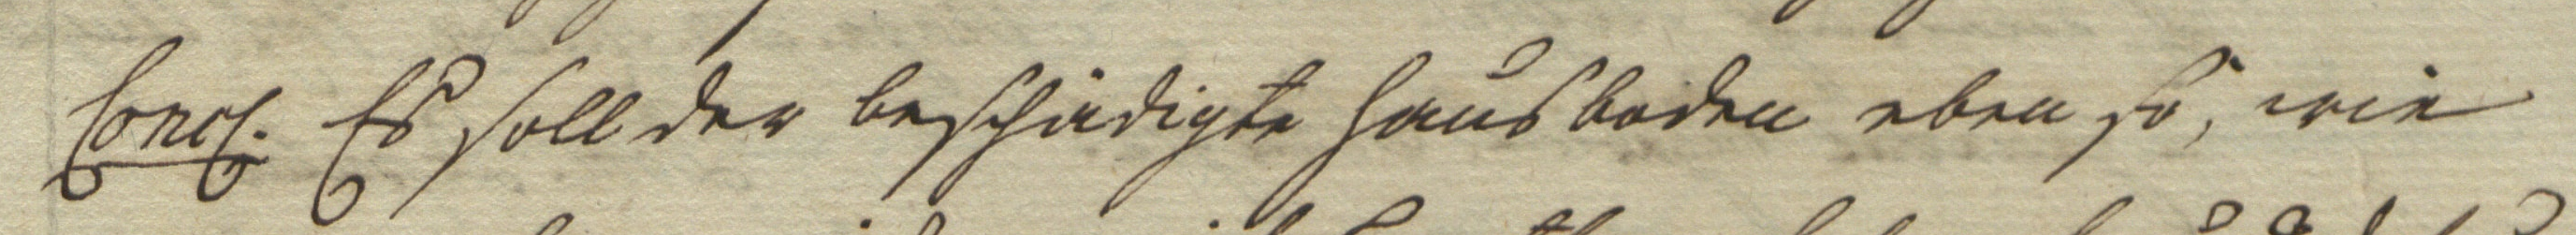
Concl. Es soll der beschädigte Hausboden eben so, wie
